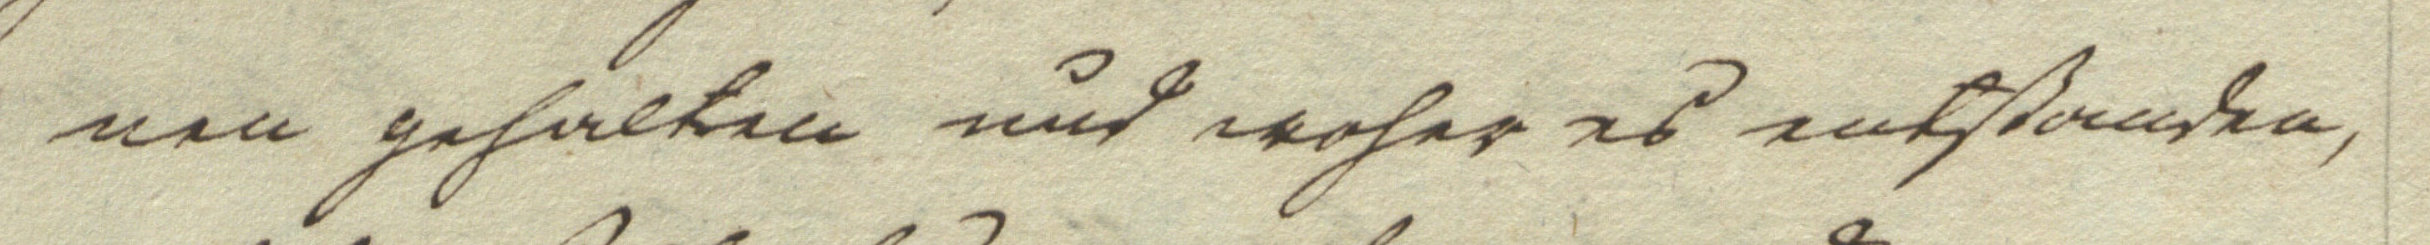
nen gehalten und woher es entstanden,
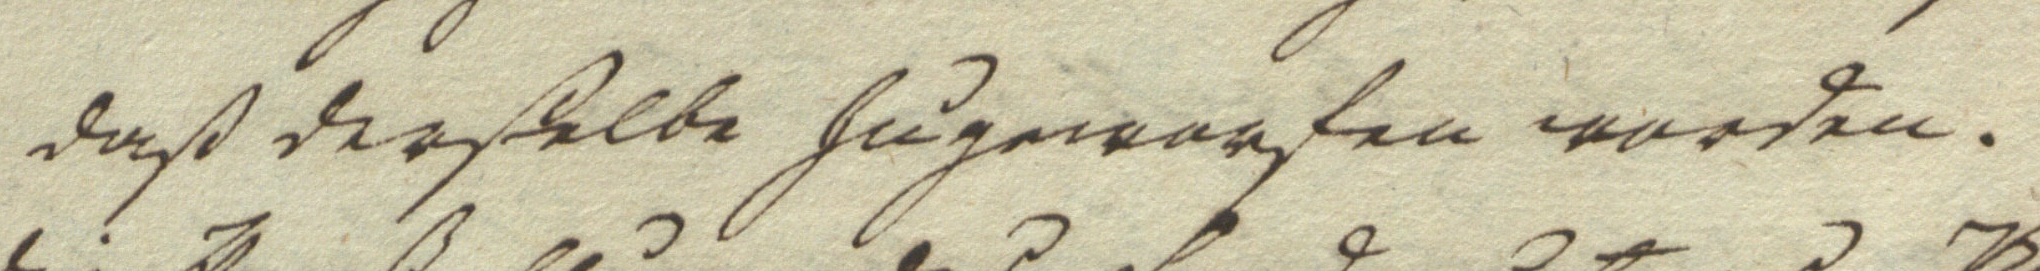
daß derselbe zugeworfen worden.
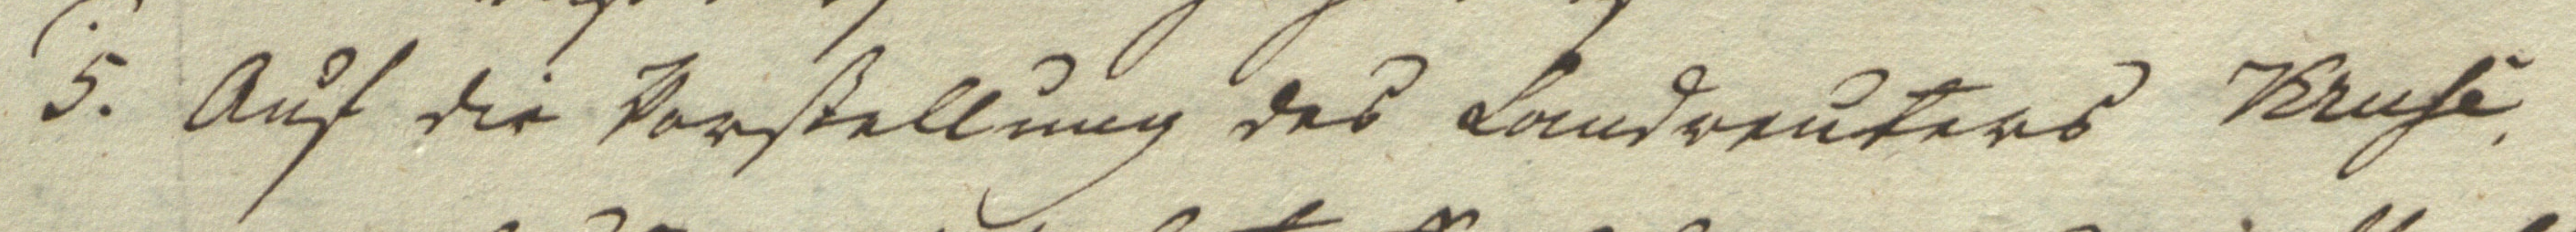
5. Auf die Vorstellung des Landreuters Kruse,
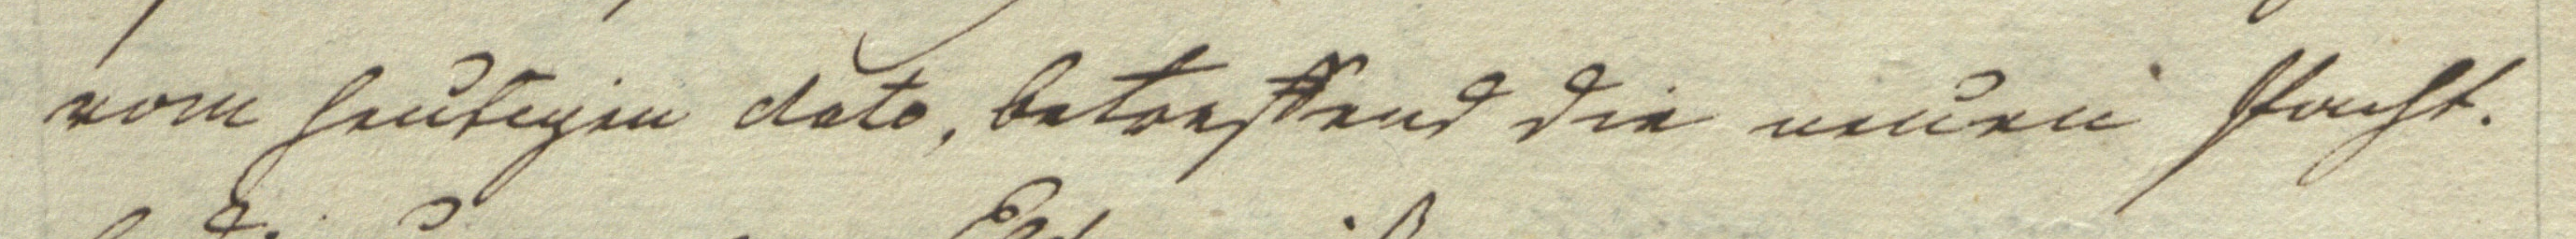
vom heutigen dato, betreffend die neuen Pacht¬
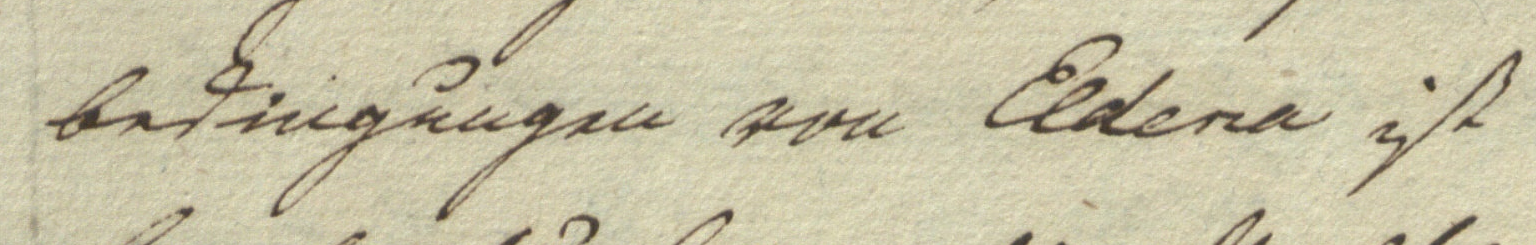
bedingungen von Eldena ist
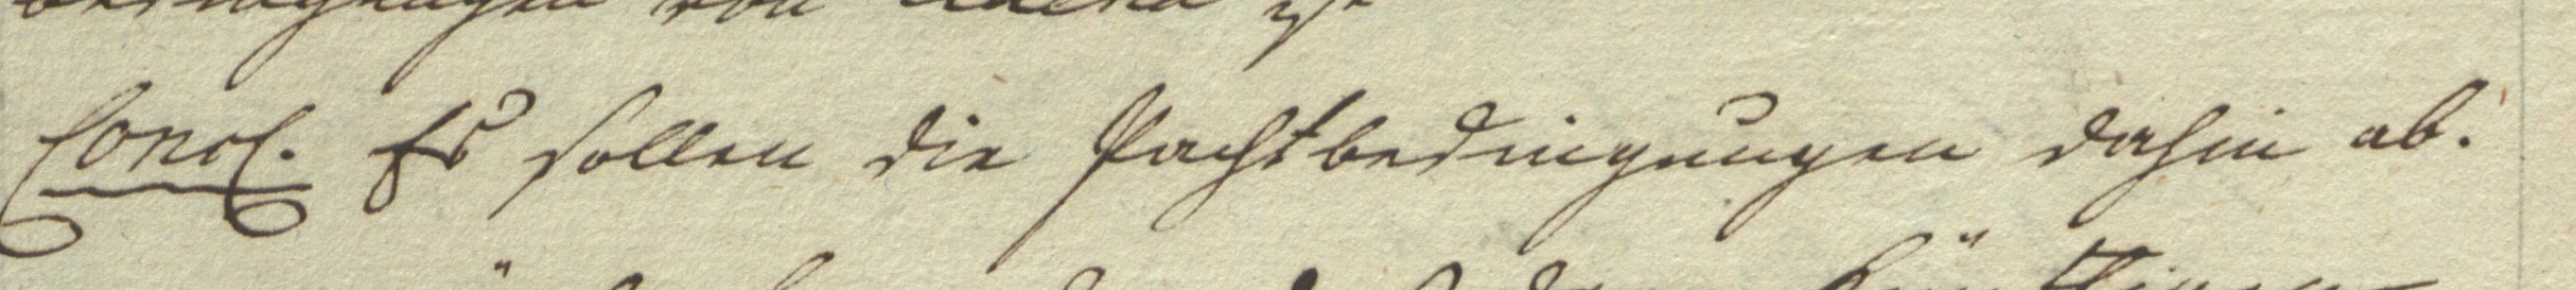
Concl. Es sollen die Pachtbedingungen dahin ab¬
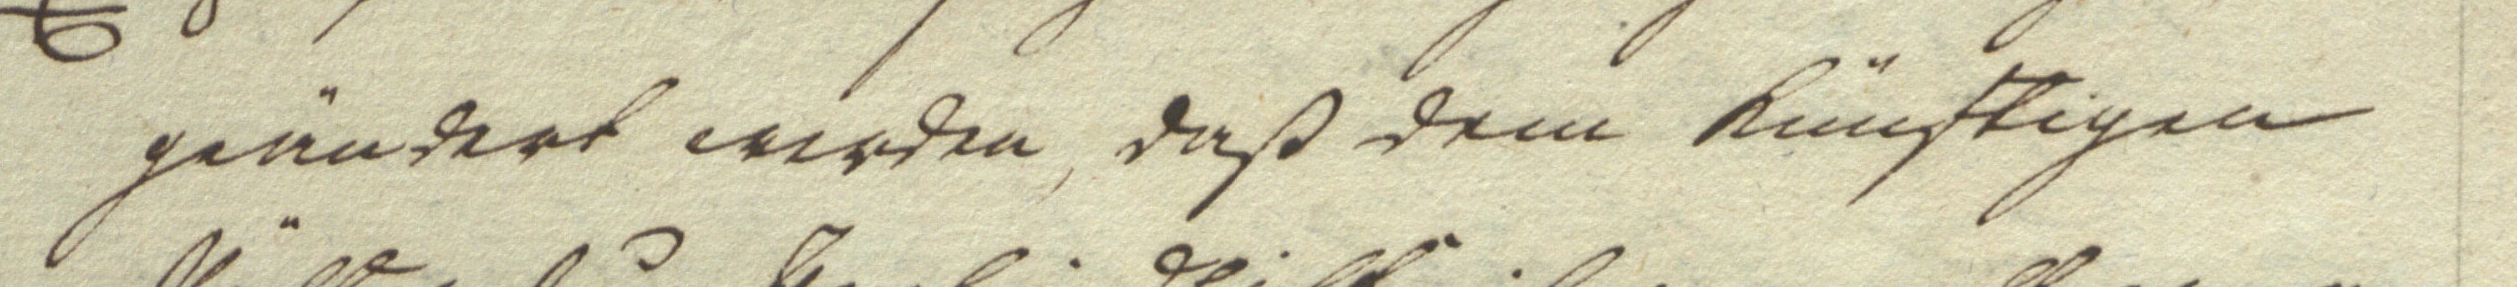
geändert werden, daß dem künftigen
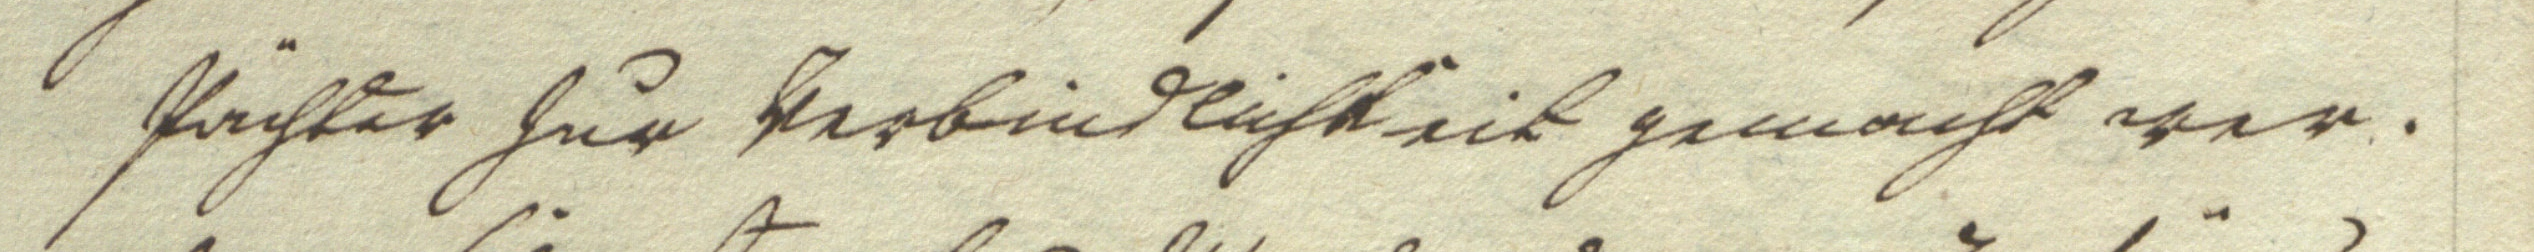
Pächter zur Verbindlichkeit gemacht wer¬
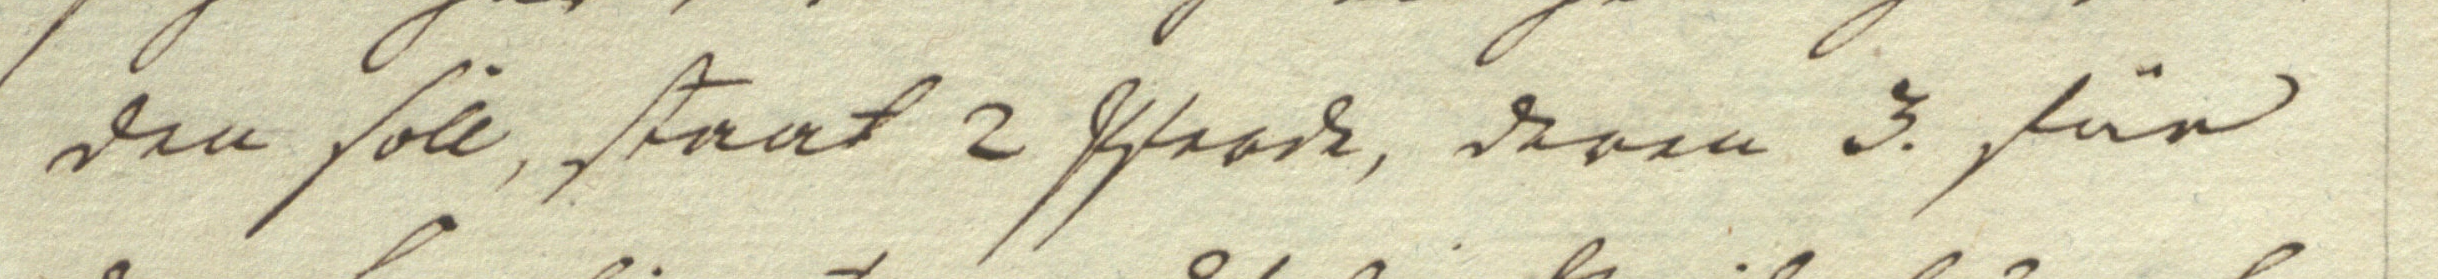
den soll, staat 2 Pferde, deren 3. für
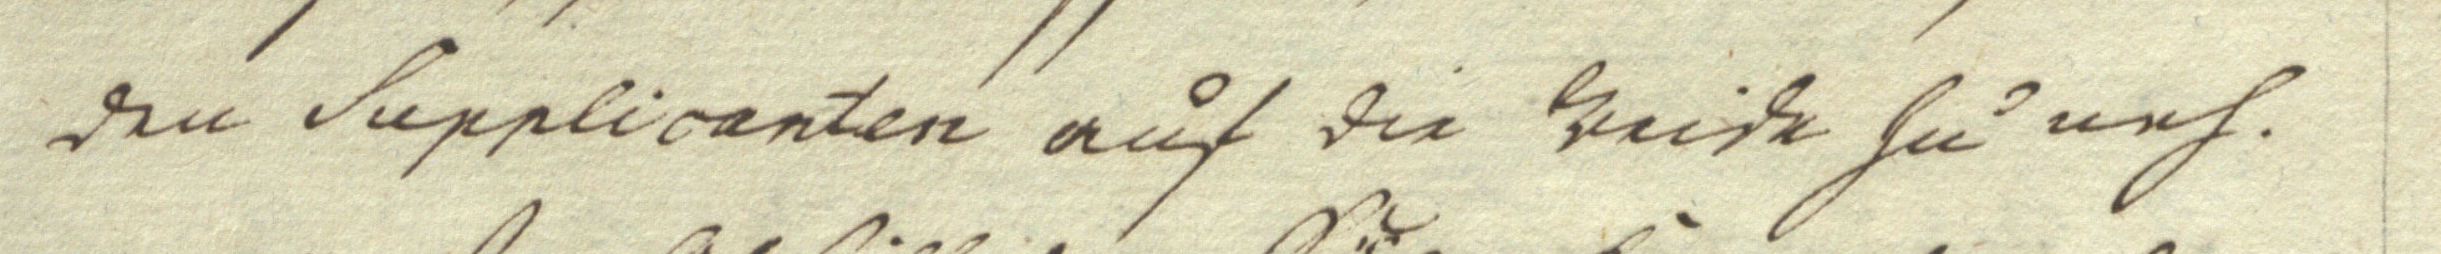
den Supplicanten auf die Weide zu neh-
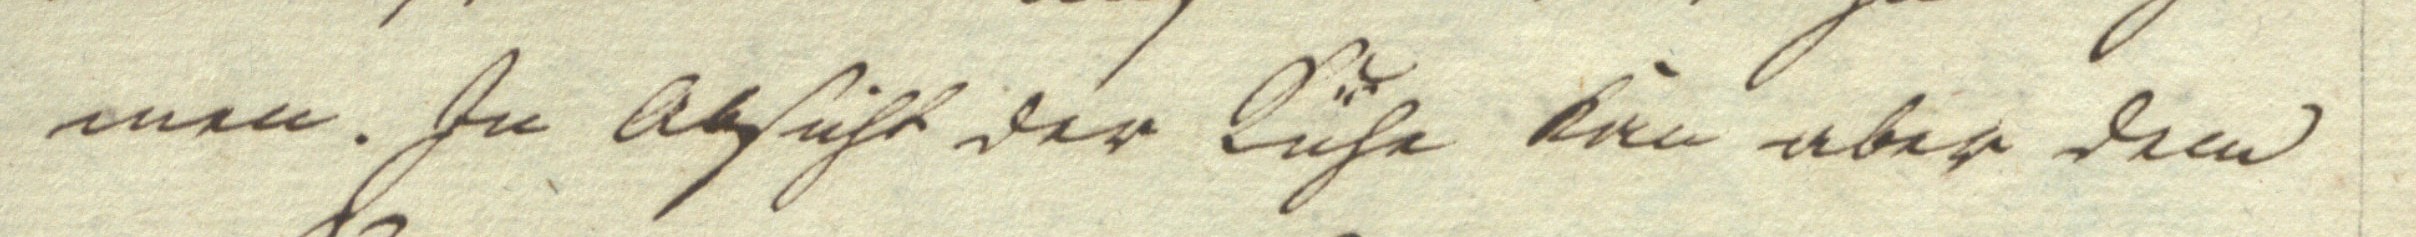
men. In Absicht der Kühe kan aber dem
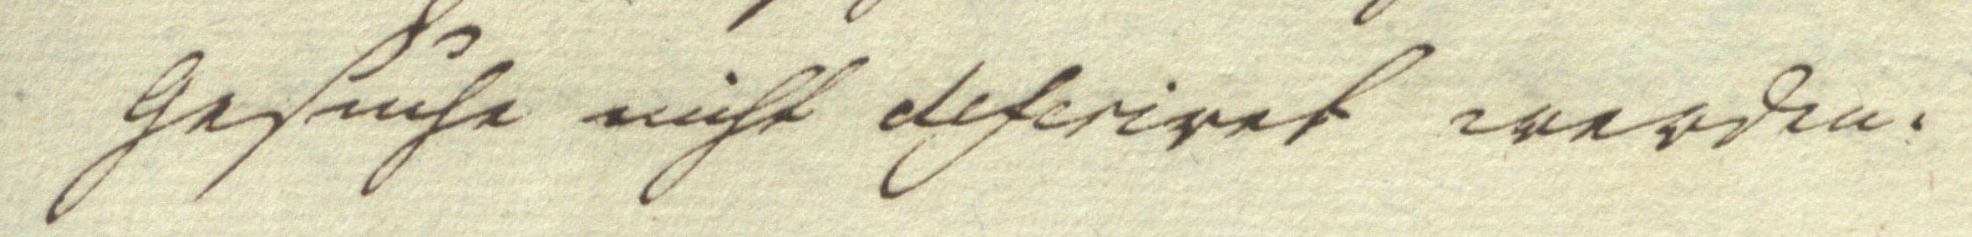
Gesuche nicht deferiret werden.
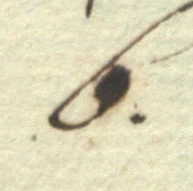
6.
